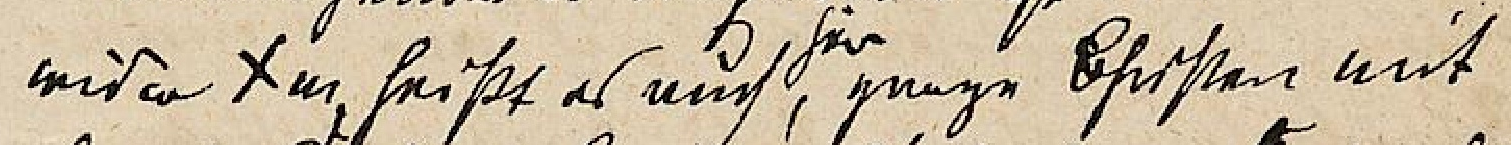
wider Χm heißt es auch, ganze Christen mit
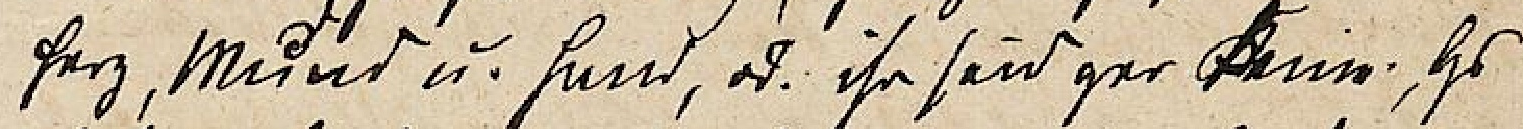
Herz, Mund u. Hand, od. ihr seid gar keine. Gs
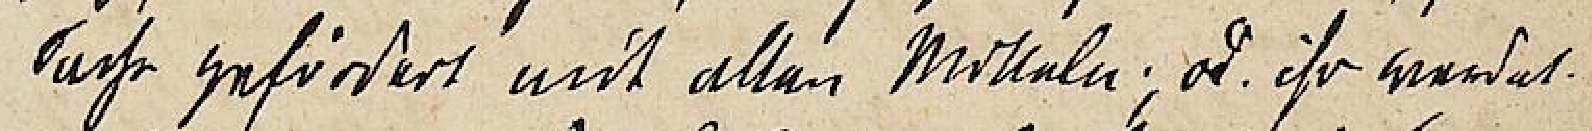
Sache gefördert mit allen Mitteln; od ihr werdet
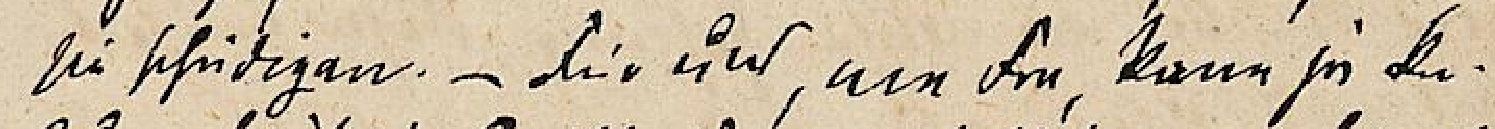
sie schädigen. _ Für uns, mn Frn, kann ja kn.
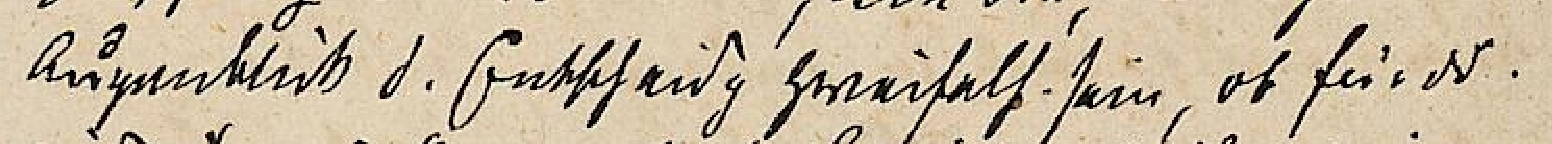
Augenblick d Entscheidg zweifelh. sein, ob für od.
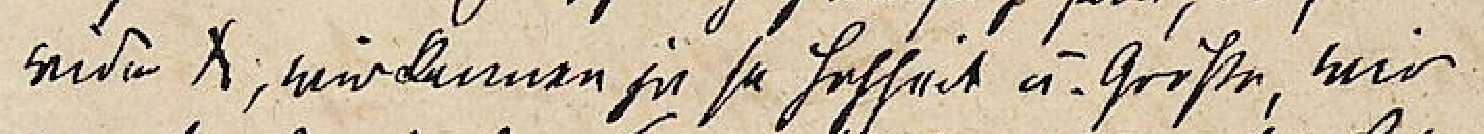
wider Χ, wir kennen ja sn Hohheit u. Größe, wir
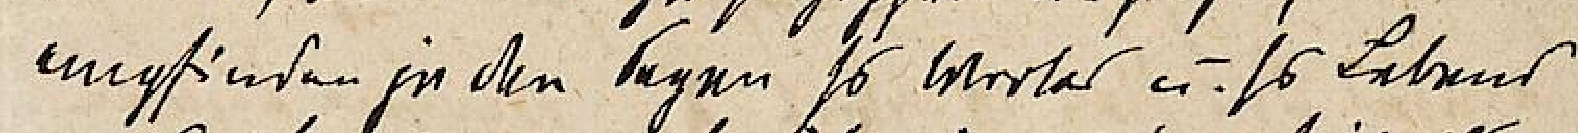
empfingen ja den Segen ss Wortes u ss Lebens
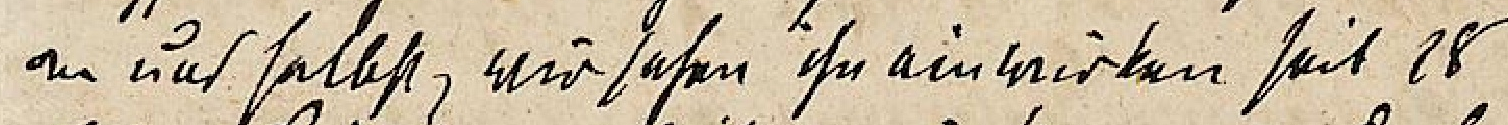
an uns selbst, wir sehen ihn einwirken seit 18
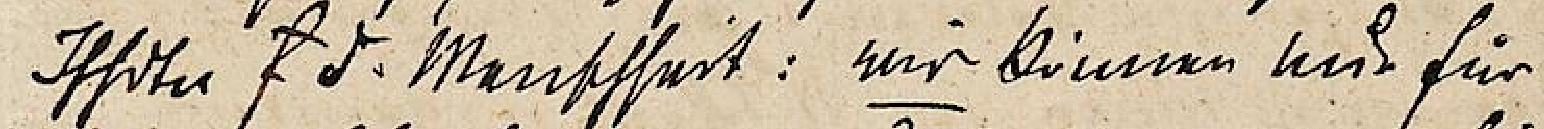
Jhhdtn f d. Menschheit: wir können nur für
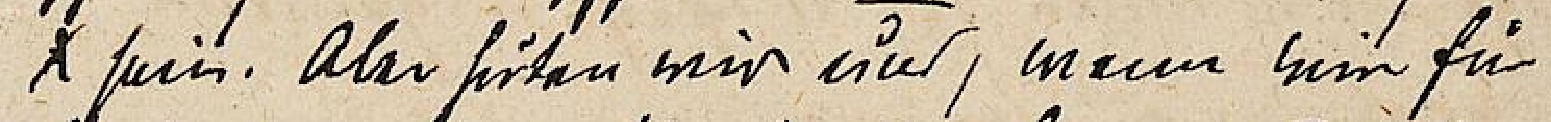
Χ sein. Aber hüten wir uns, wenn wir für
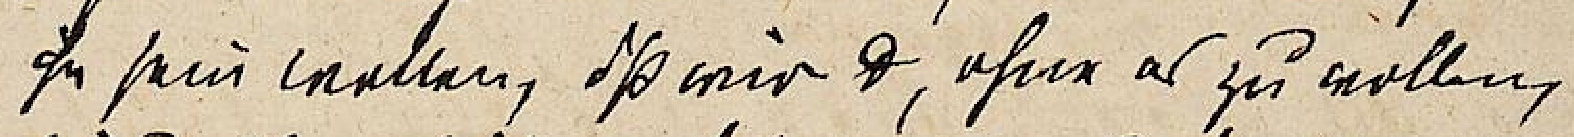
ihn sein wollen, dß wir o, ohne es zu wollen,
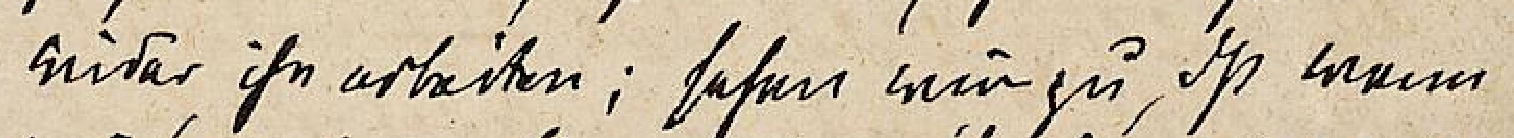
wider ihn arbeiten; sehen wir zu, dß wenn
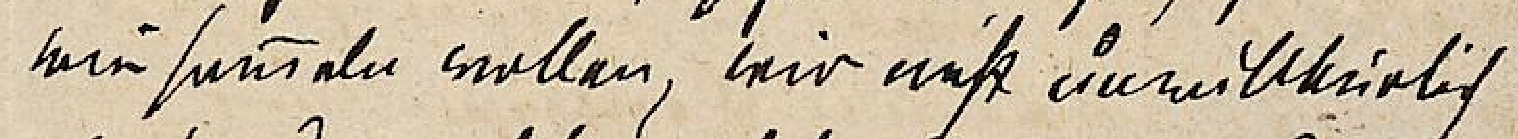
wir sameln wollen, wir nicht unwillkürlich
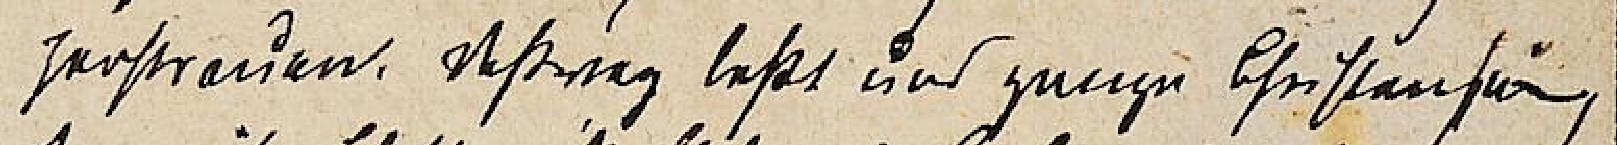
zerstreuen. Deßweg. laßt uns ganze Christen sein,
